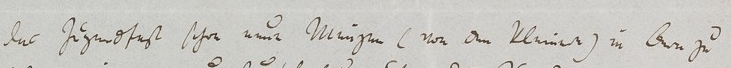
das Jugendfest schon neue Münzen (von den kleinern) in Bern zu
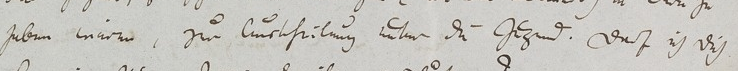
haben wären, zur Austheilung unter die Jugend. Darf ich Dich
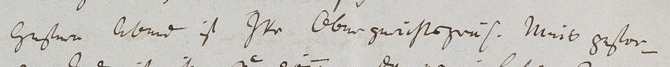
Gestern Abend ist Jkr. Obergerichtspräs. Meis gestor-
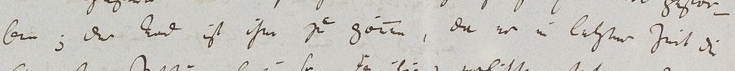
ben; der Tod ist ihm zu gönnen, da er in letzter Zeit die
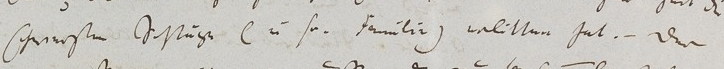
schwersten Schläge (in sr. Familie) erlitten hat. – Der
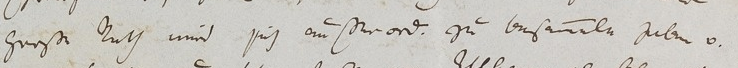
Große Rath wird sich außerord. zu besammeln haben &.
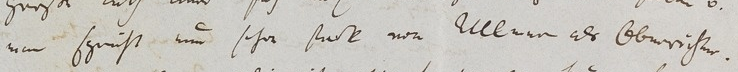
man spricht nun schon stark von Ullmer als Oberrichter.
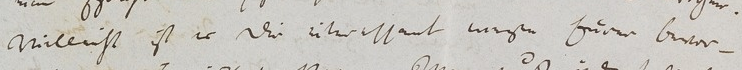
Vielleicht ist es Dir interessant wegen Eurer bevor-
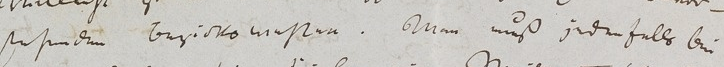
stehenden Bezirkswahlen. Man muß jedenfalls bei
